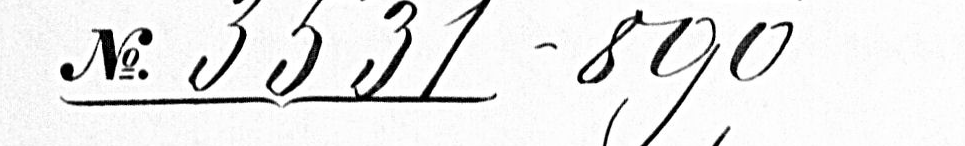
N° 3531-890
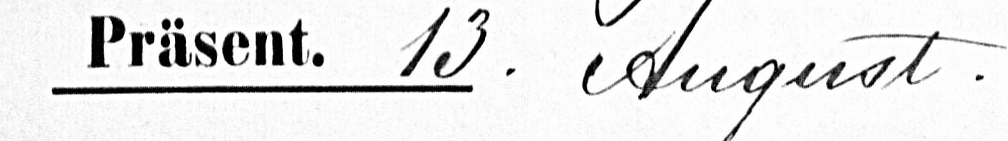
Präsent. 13. August.
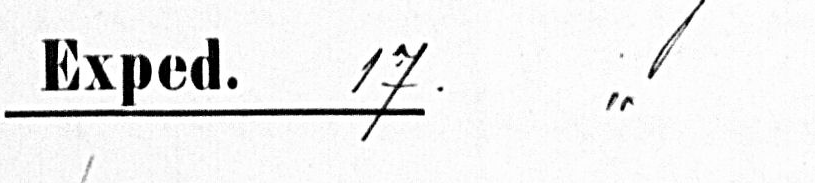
Exped. 17. August.
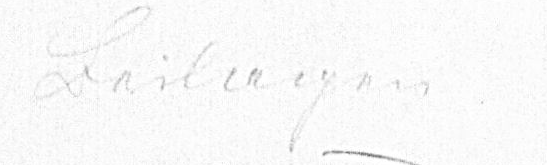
Beilagen
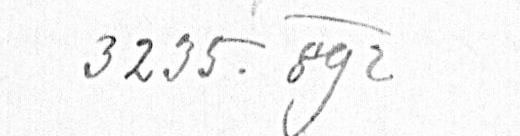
3235.892
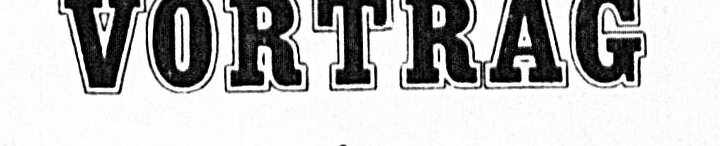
VORTRAG
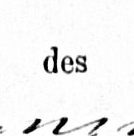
des
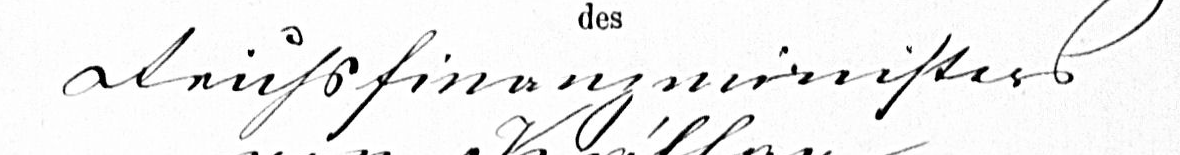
Deichsfinanzministers
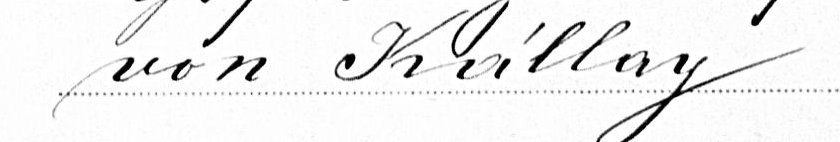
von Kállay
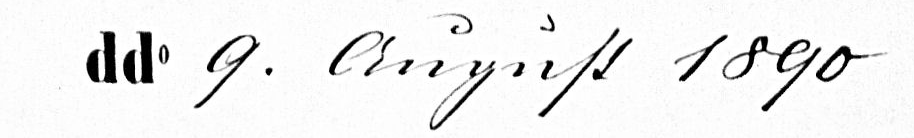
dd° 9. August 1890
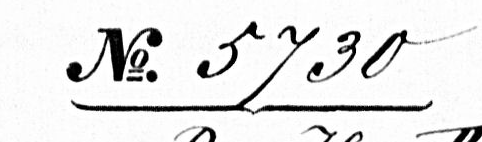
N° 5730,
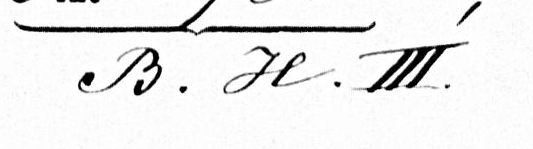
B. H. III
